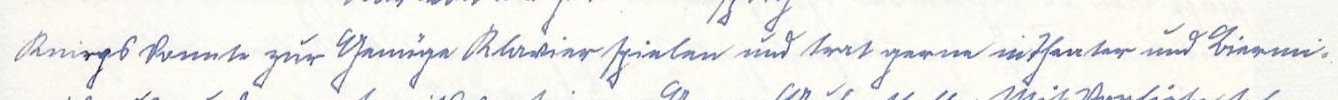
Knirps konnte zur Genüge Klavier spielen und trat gerne in Theater und Biermi-
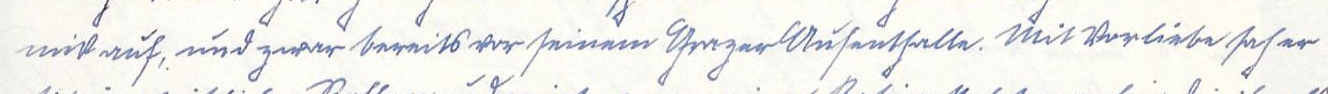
mik auf, und zwar bereits vor seinem Grazer Aufenthalte. Mit Vorliebe sah er
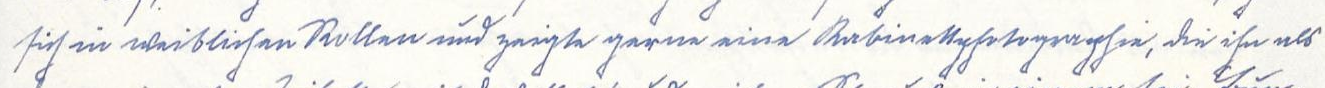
sich in weiblichen Rollen und zeigte gerne eine Kabinettphotographie, die ihn als
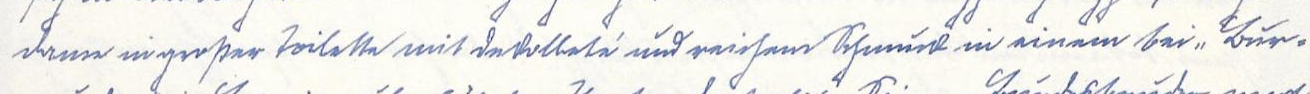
Dame in großer Toilette mit Dekollete und reichem Schmuck in einem bei „Burg-
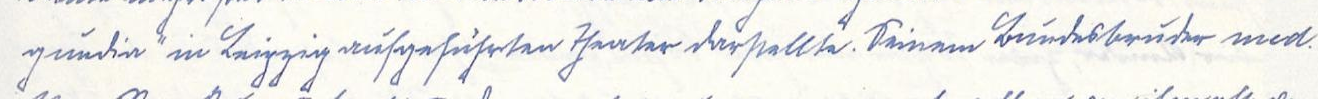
gundia“ in Leipzig aufgeführten Theater darstellte. Sinem Bundesbruder med.
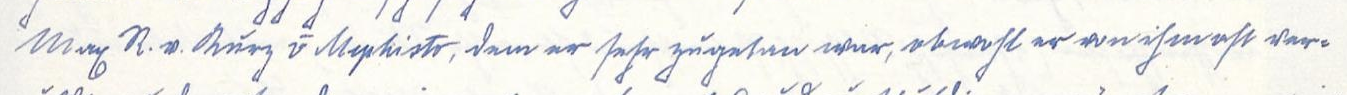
Max R. v. Kurz v/o Mephisto, dem er sehr zugetan war, obwohl er von ihm oft ver-
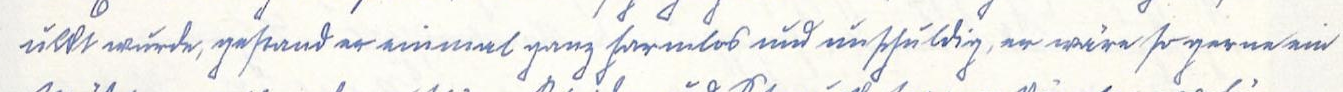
ulkt wurde, gestand er einmal ganz harmlos und unschuldig, er wäre so gerne ein
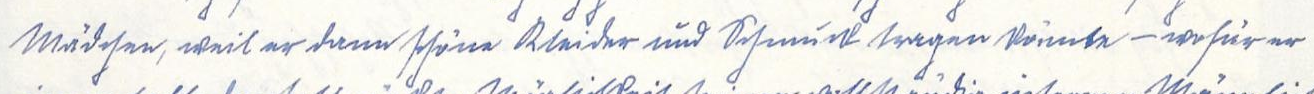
Mädchen, weil er dann schöne Kleider und Schmuck tragen könnte - wofür er
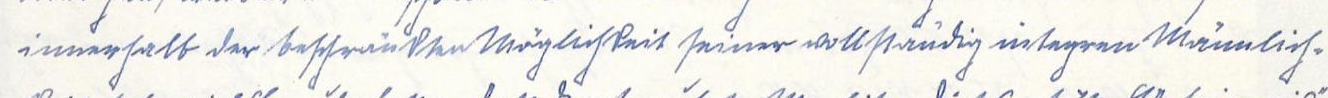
innerhalb der beschränkten Möglichkeit seiner vollständig integren Männlich-
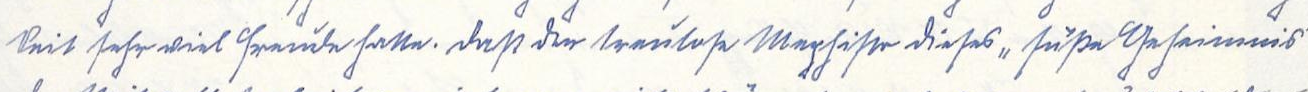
keit sehr viel Freude hatte. Dass der treulose Mephisto dieses „süße Geheimnis"
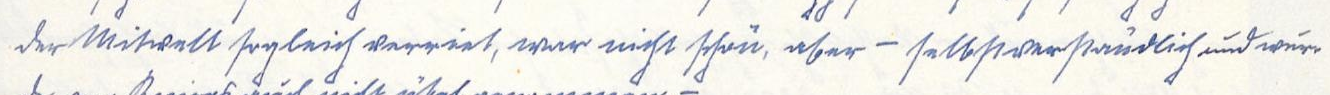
der Mitwelt sogleich verriet, war nicht schön, aber -selbstverständlich und wur-
